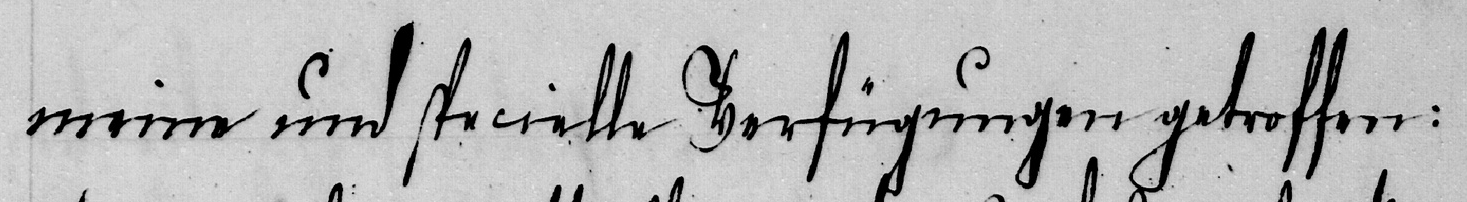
meine und specielle Verfügungen getroffen:
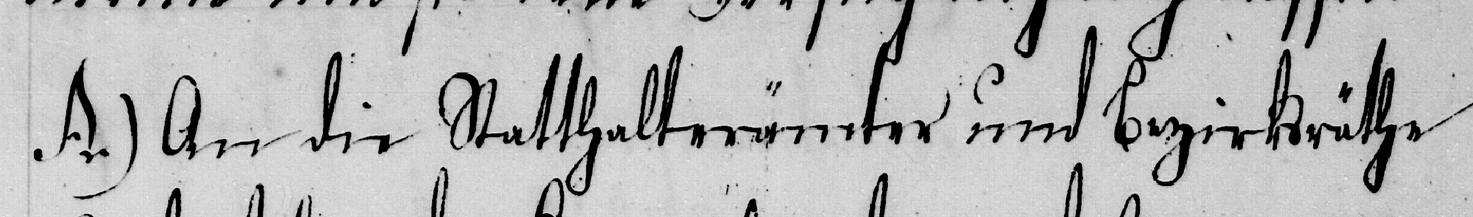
A.) An die Statthalterämter und Bezirksräthe
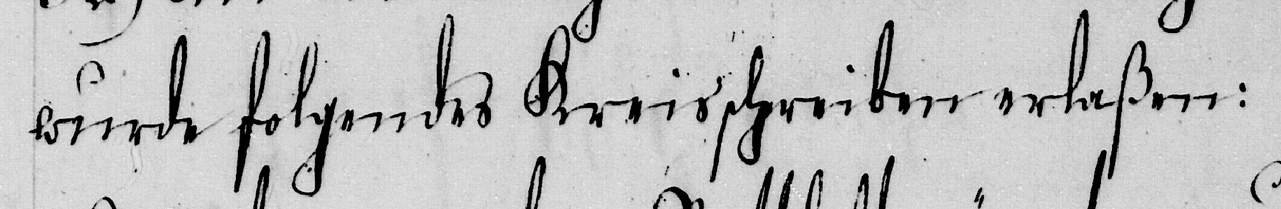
wurde folgendes Kreisschreiben erlaßen:
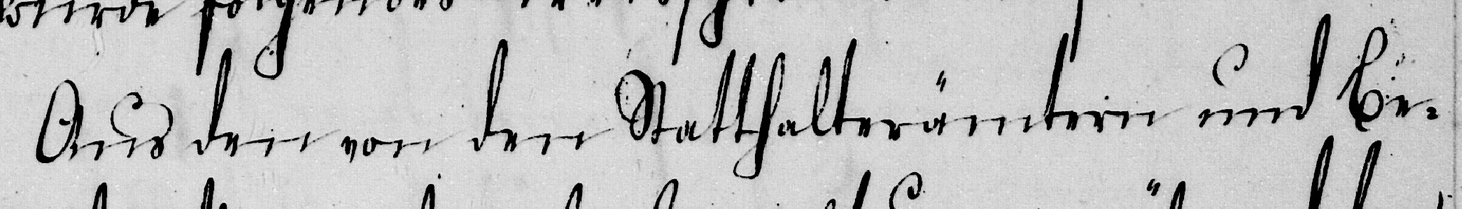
Aus den von den Statthalterämtern und Be¬
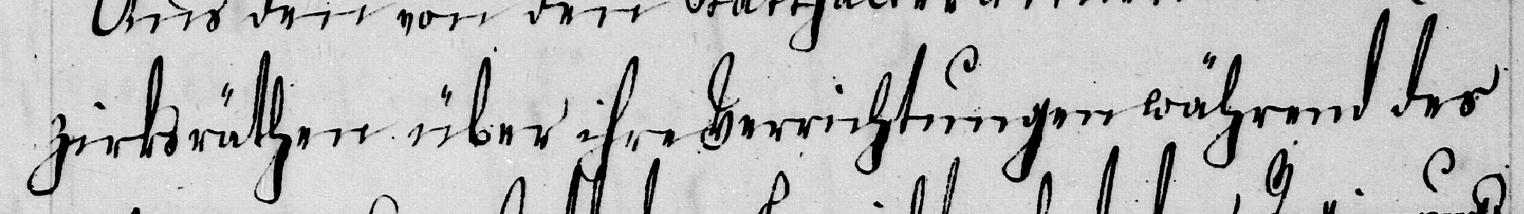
zirksräthen über ihre Verrichtungen während des
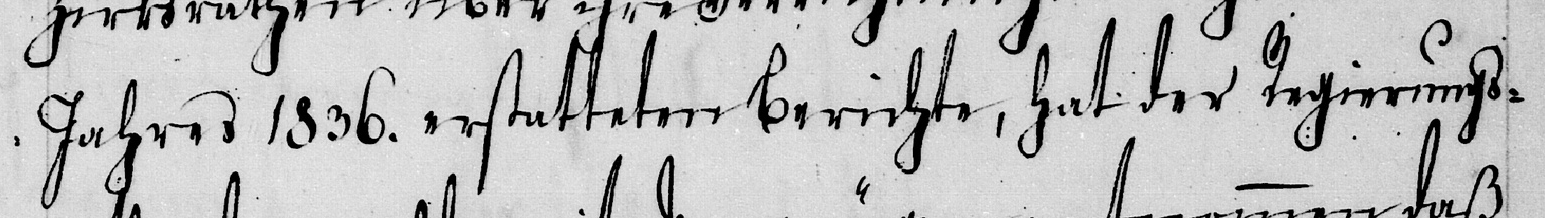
Jahres 1836. erstatteten Berichte, hat der Regierungs¬
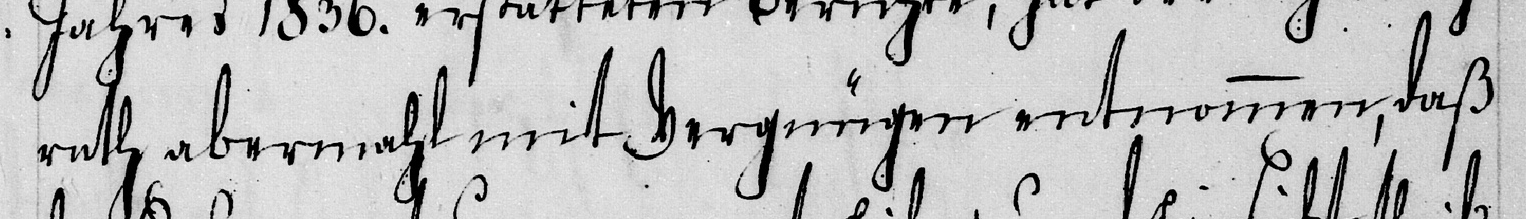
rath abermahl mit Vergnügen entnommen, daß
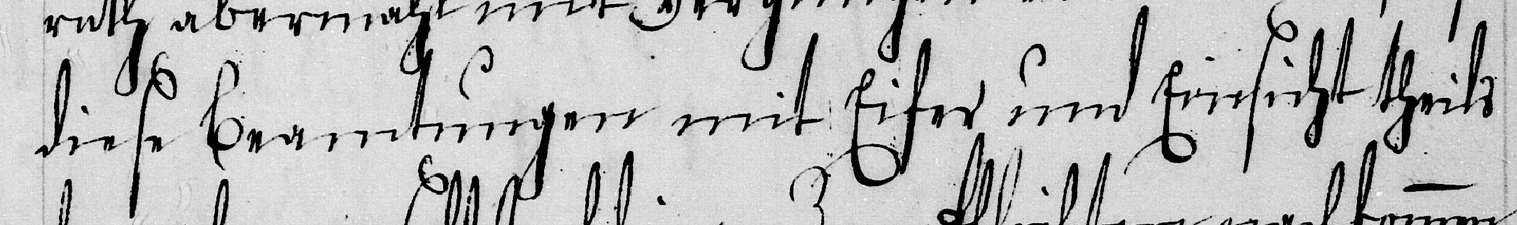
diese Beamtungen mit Eifer und Einsicht theils
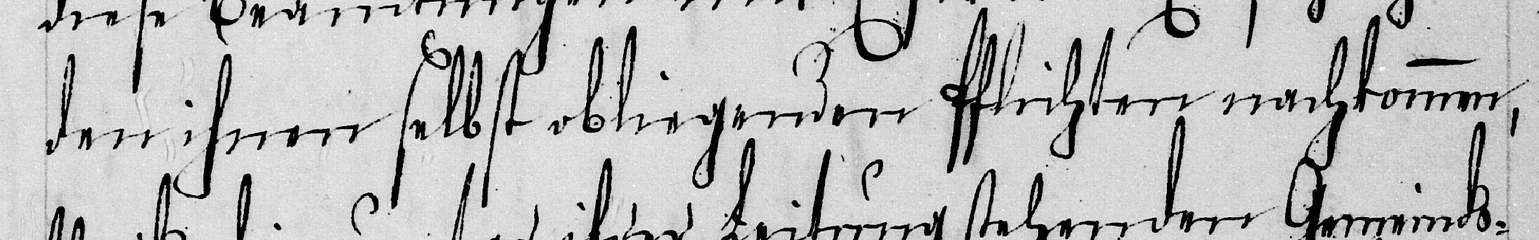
den ihnen selbst obliegenden Pflichten nachkomme¬
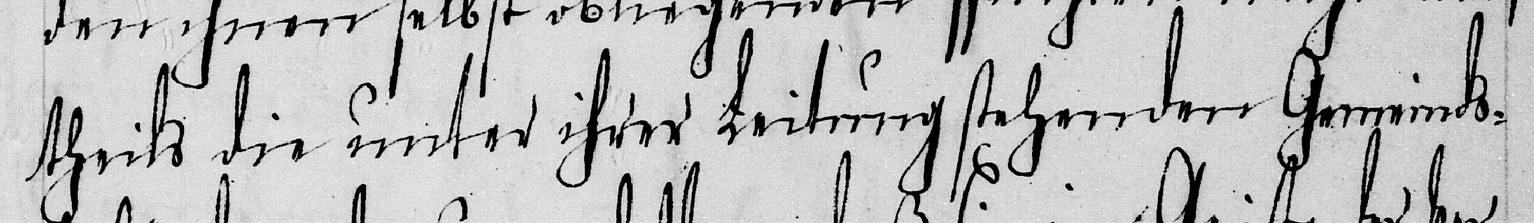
theils die unter ihrer Leitung stehenden Gemeinds¬
